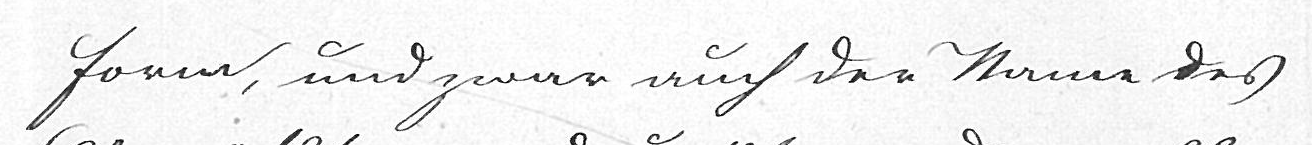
form, und zwar auch der Name des
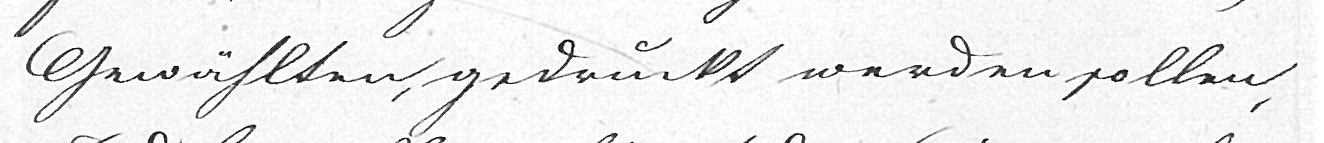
Gewählten, gedruckt werden sollen
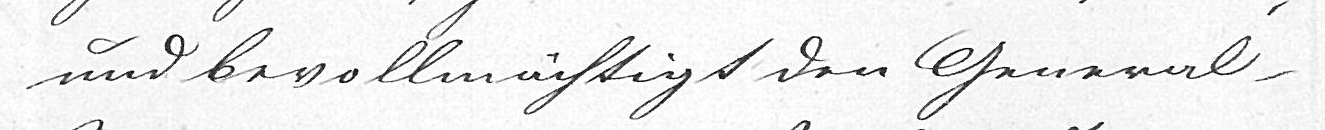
und bevollmächtigt den General-
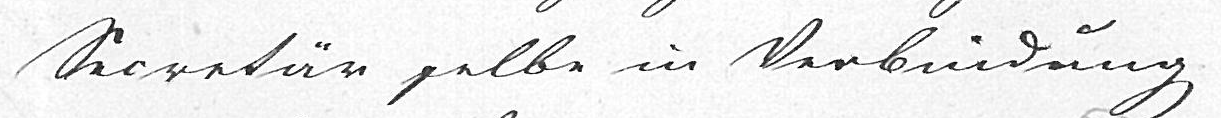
Secretär selbe in Verbindung
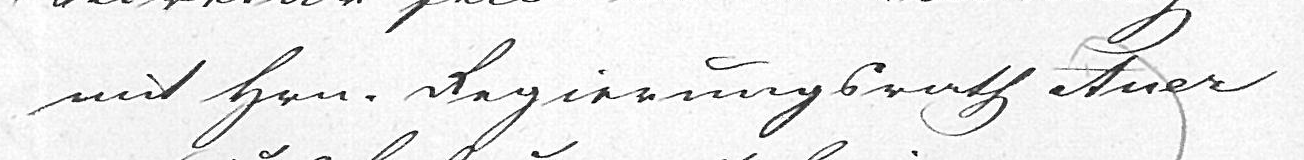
mit Hrn. Regierungsrath Auer
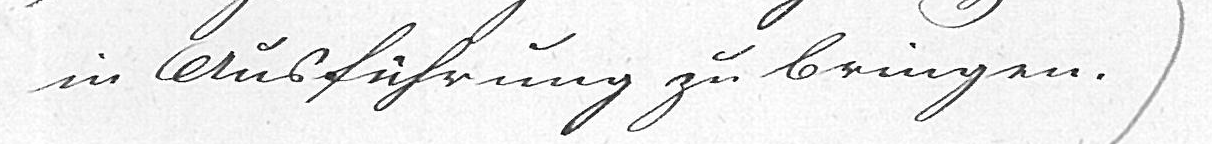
in Ausführung zu bringen.
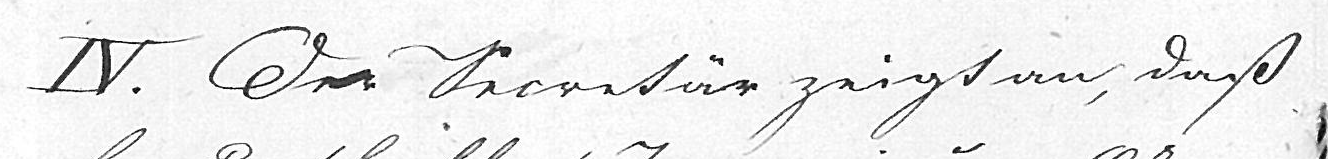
IV. Der Secretär zeigt an, daß
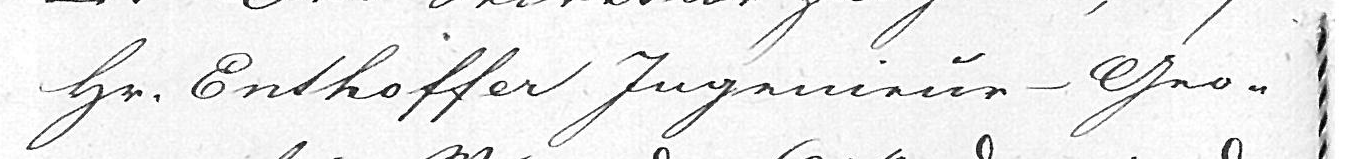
Hr. Enthoffer Ingenieur-Geo-
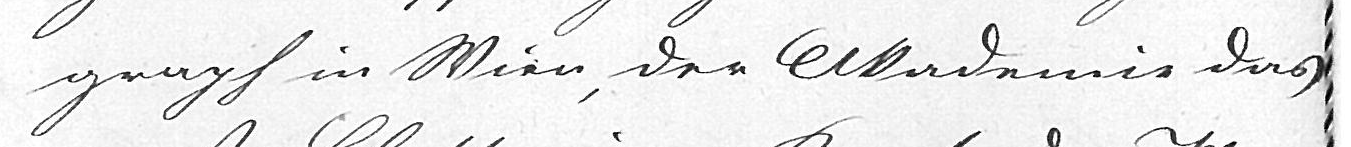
graph in Wien, der Akademie das
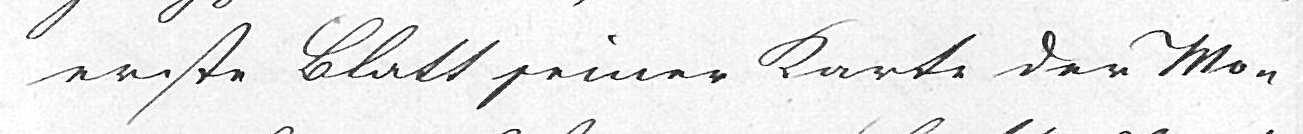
erste Blatt seiner Karte der Mo-
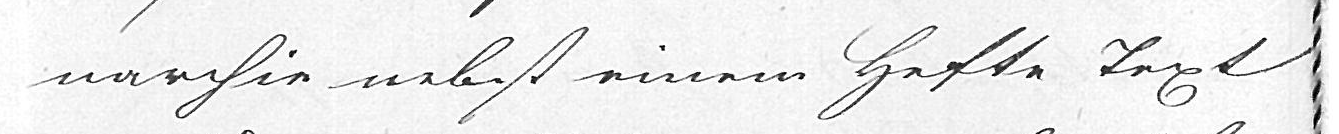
narchie nebst einem Hefte Text
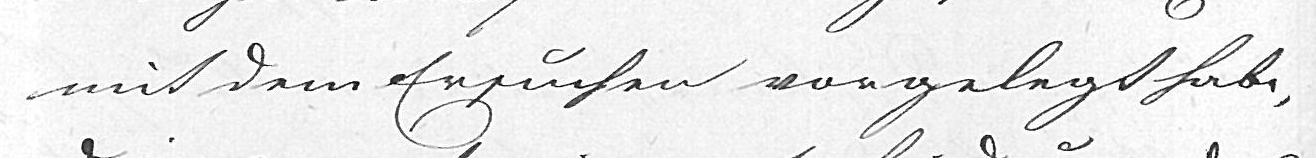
mit dem Ersuchen vorgelegt habe,
